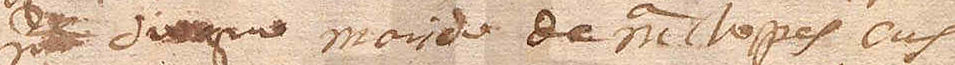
mte dioguo marido de ma lopes cris
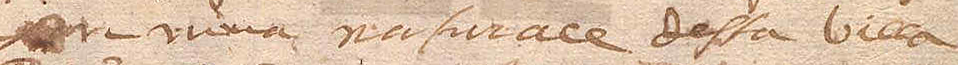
tam noua naturall desta villa
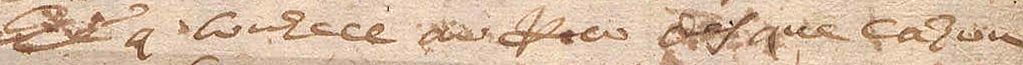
he q̄ conhece ao Reo des que cazou
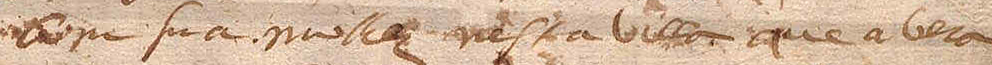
com sua molher nesta villa que avera
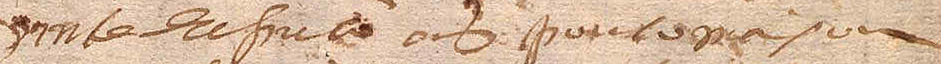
vinte he sinco ans̄ pouco mais ou
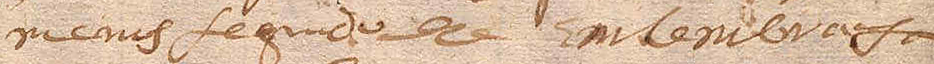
menus segundo he em lembransa
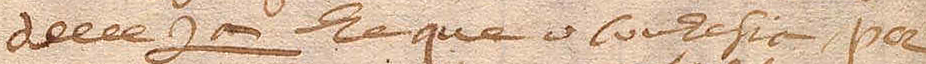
delle ta he que o conhesia por
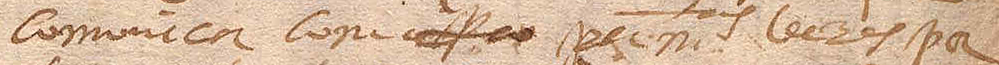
comunicar com o Reo per mtas vezes por
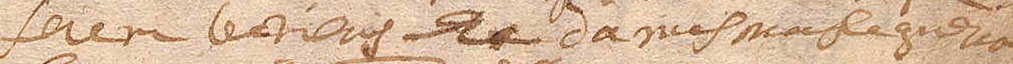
serem vezinhos he da mesma freguezia
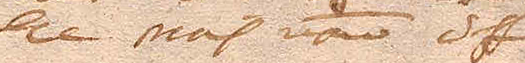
he mais não disse
